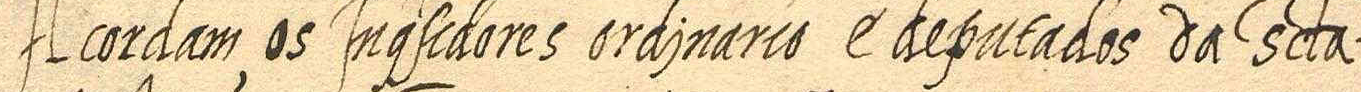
Acordam os Jnq̄sidores ordinario e deputados da s̄cta
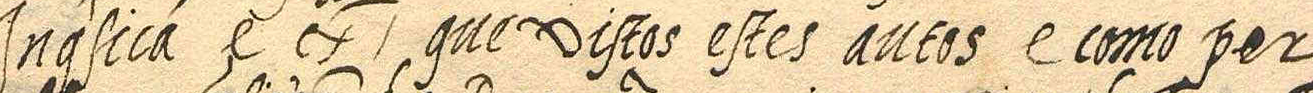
Jnq̄siçā e cꝭ̄ / que Vistos estes autos e como per
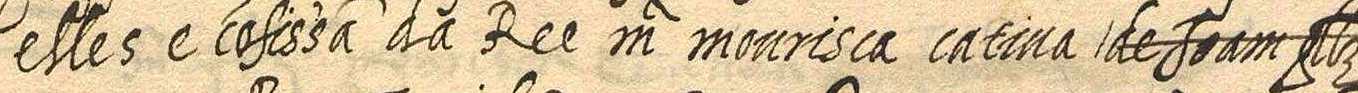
elles e cōfissā da Ree ma mourisca catiua / de Joam gl̄lz
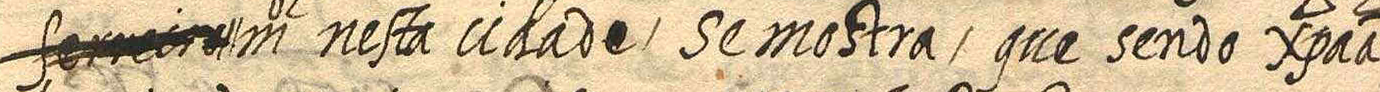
ferreira / mor nesta cidade / se mostra / que sendo xpaā
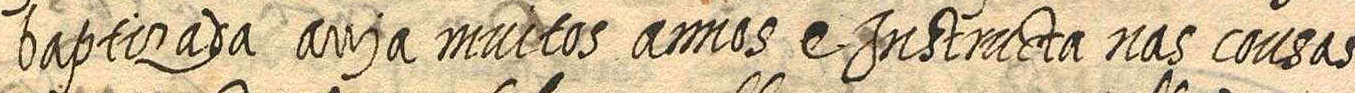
baptizada auja muitos annos e Jnstructa nas cousas
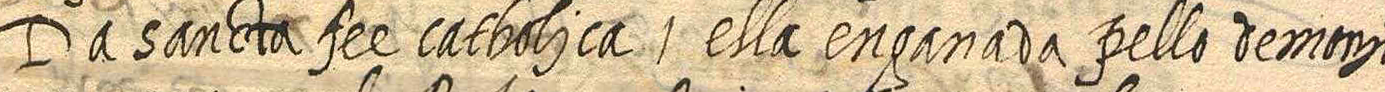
Da sancta fee catholica / ella enganada pello demonjo
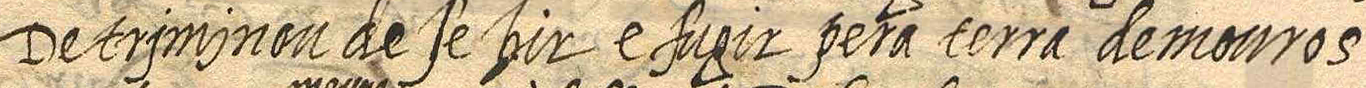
Detrjmjnou de se hir e fugir pera terra de mouros
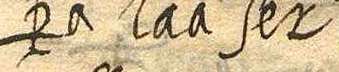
ꝑa laa ser
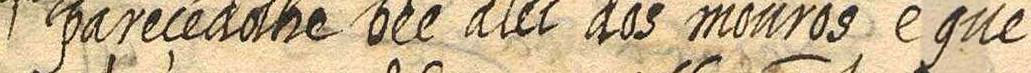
pareçēdolhe bēe a lei dos mouros e que
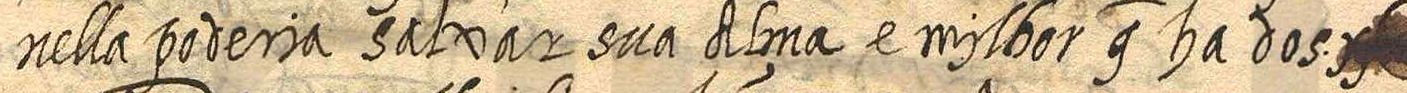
nella poderia salvar sua Alma e mjlhor q̄ a dos
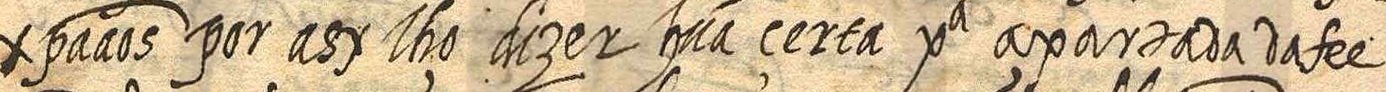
xp̄aaos por asy lho dizer hūa certa pa apartada da fee
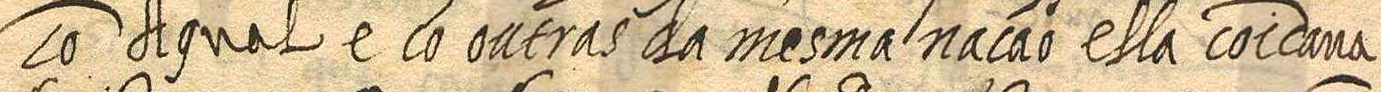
cō A qual e cō outras da mesma nação ella coidaua
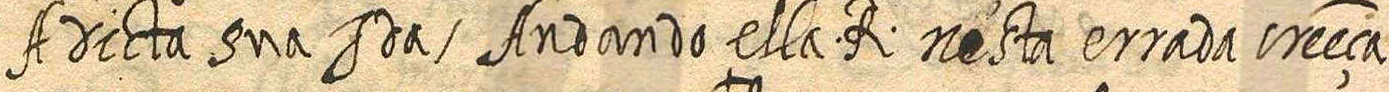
A dicta sua Jda / Andando ella .R. nesta errada crēeça
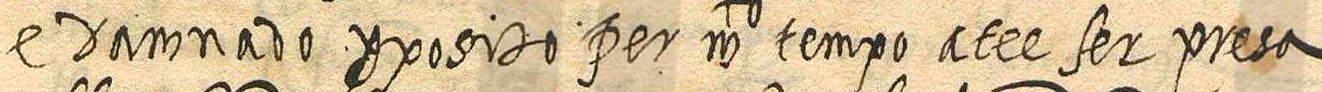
e Damnado ꝓposito per mto tempo atee ser presa
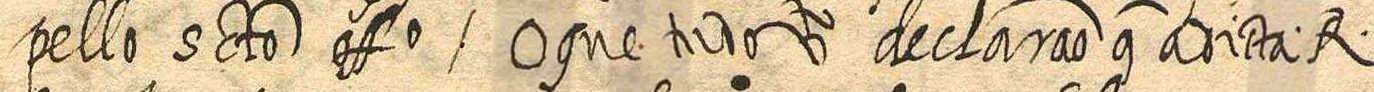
pello sctō offo / O que tudo vto declarão q̄ a dicta .R.
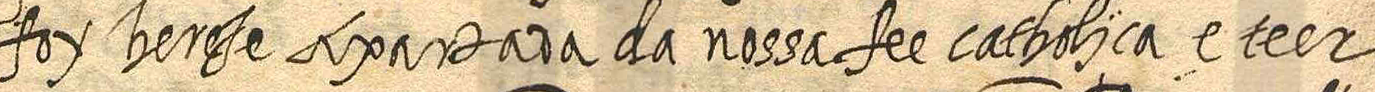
foy herege apartada da nossa fee catholica e teer
